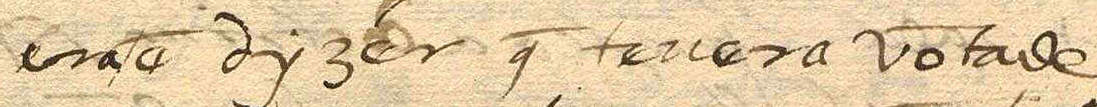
era ē dyzēr q̄ teuera vōtade
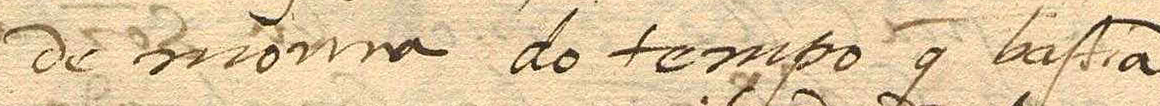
de moura do tempo q̄ bastiā
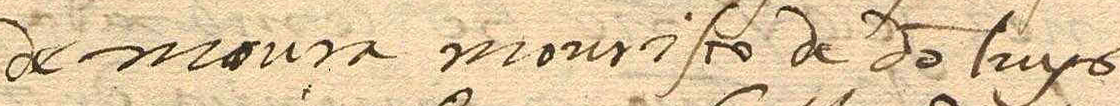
de moura mourisco de dō luys
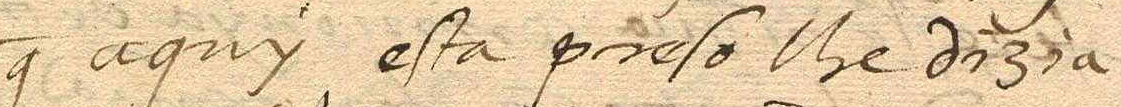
q̄ aquy esta preso lhe dizia
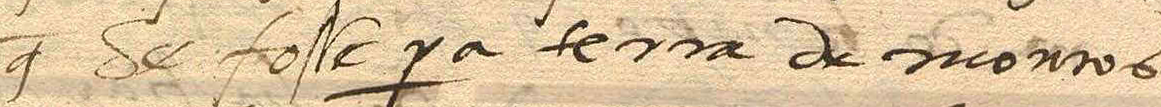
q̄ se fosse ꝑa terra de mouros
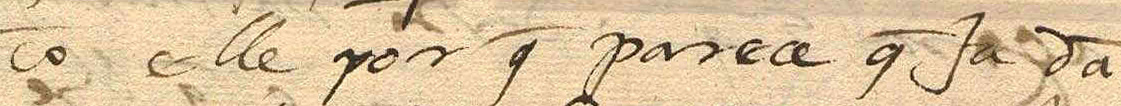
cō elle porq̄ parece q̄ Ja dā
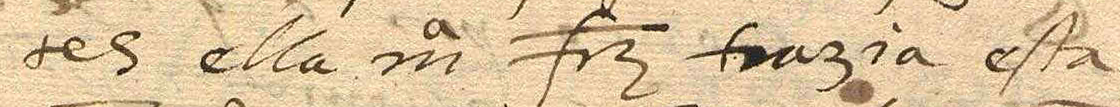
tes ella ma fr̄z trazia esta
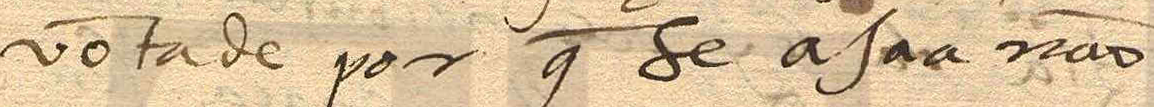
vōtade porq̄ se a Jaa não
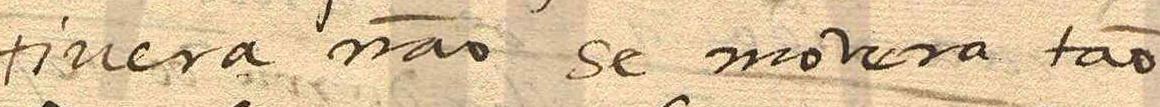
tiuera não se movera tão
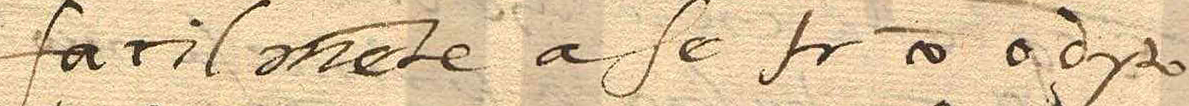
facilmēte a se jr cō o dyto
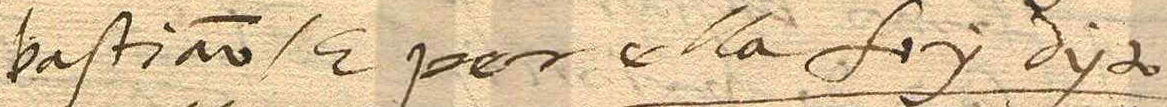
bastião / E per ella foy dyto
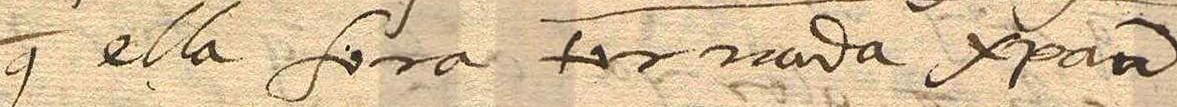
q̄ ella fora tornada xpaā
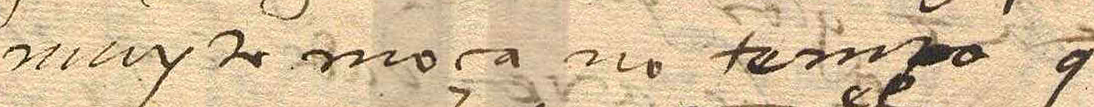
muyto moça no tempo q̄
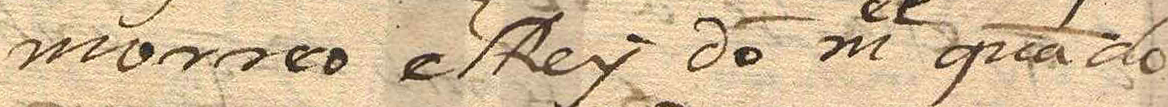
morreo el Rey dō mel qūado
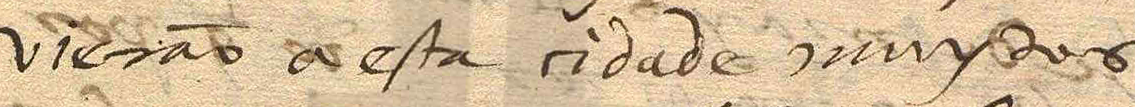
vierão a esta cidade muytos
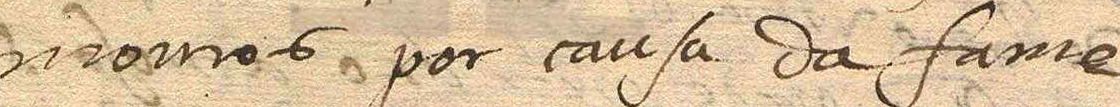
mouros por causa da fame
